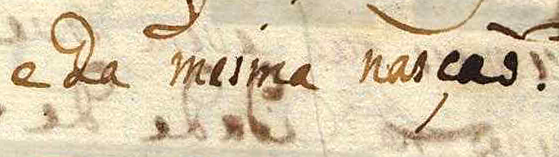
e da mesma nasçaõ.
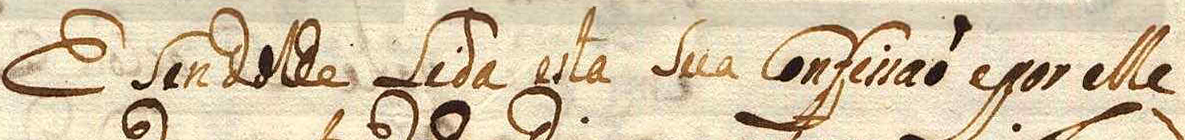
E sendolhe Lida esta Sua Confissaõ e por elle
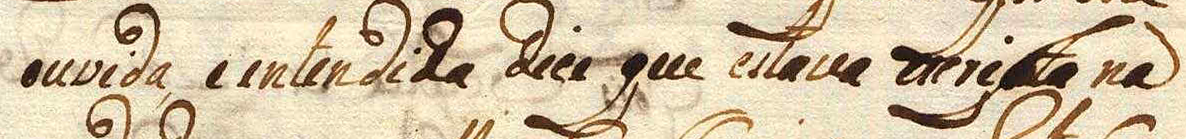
ouvida, e entendida dice que estaua escripta na
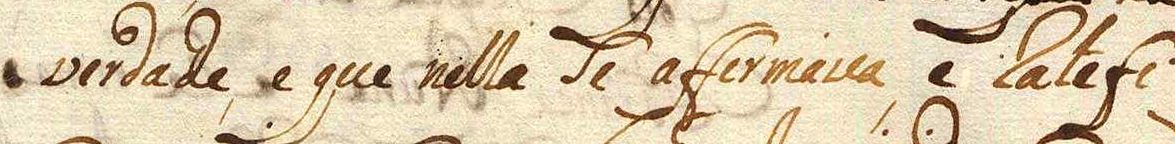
verdade, e que nella se affirmava, e Ratefi
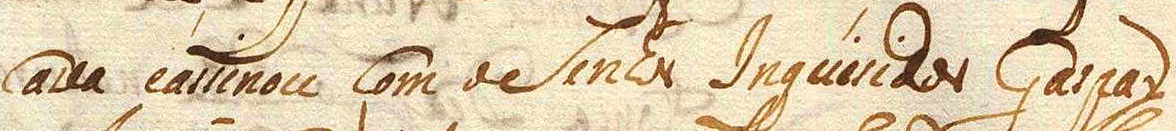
caua e assinou Com o Senhor Inquisidor Gaspar
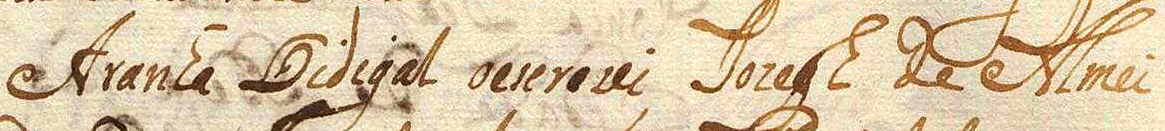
Aranha Vidigal o escreui, Iozeph de Almei
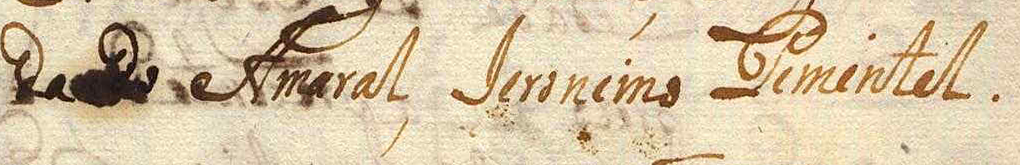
da do Amaral, Ieronimo Pimentel.
